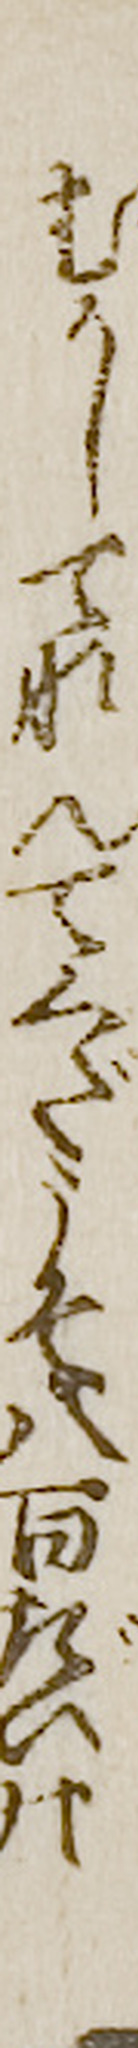むかしてれんてくだうそ八百だいの
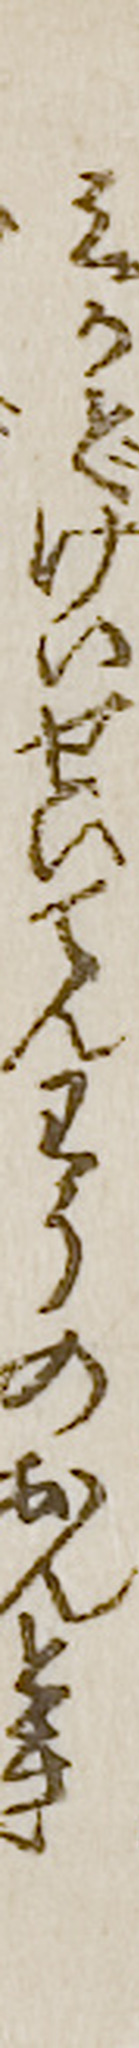みかどけいせいてんわうのおんとき
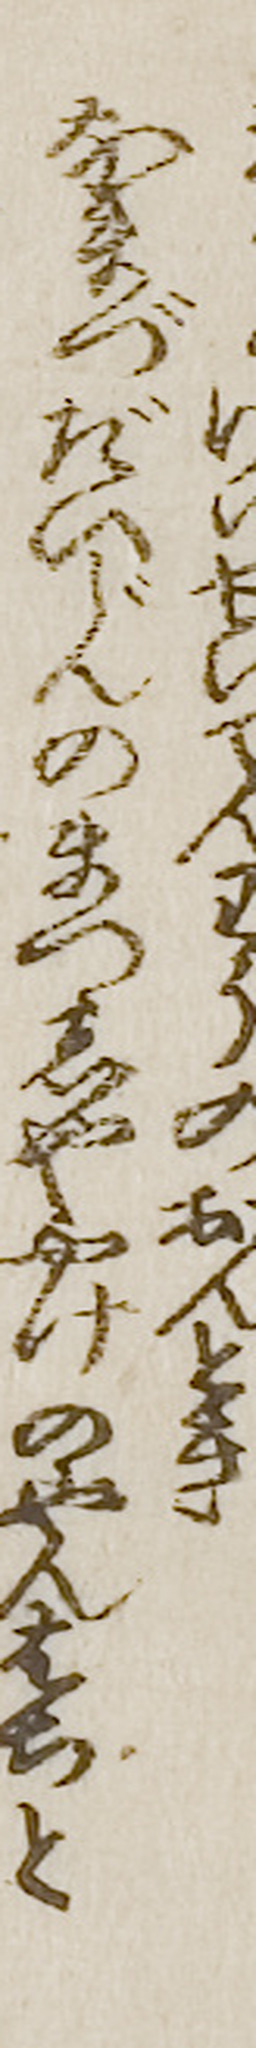なまづだいじんのまつしややけのやんはちと
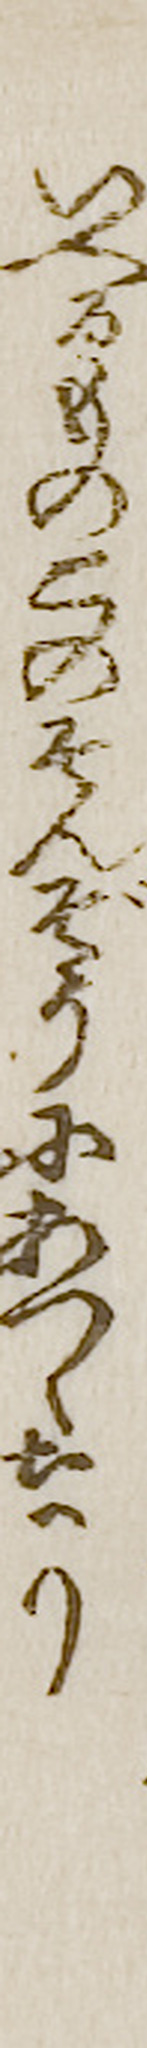いへるものこのそんぞうにあつくなり
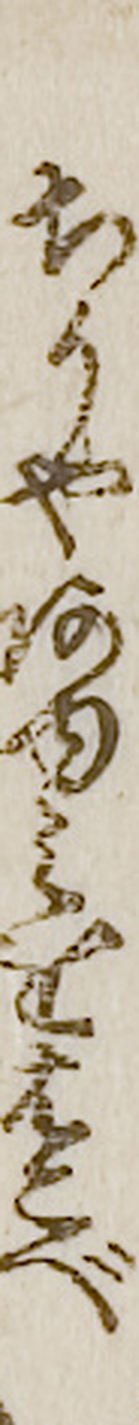ちうやあゆみをはこべ
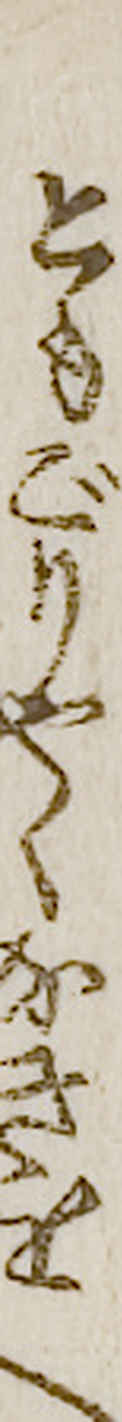ともごりやくなきを
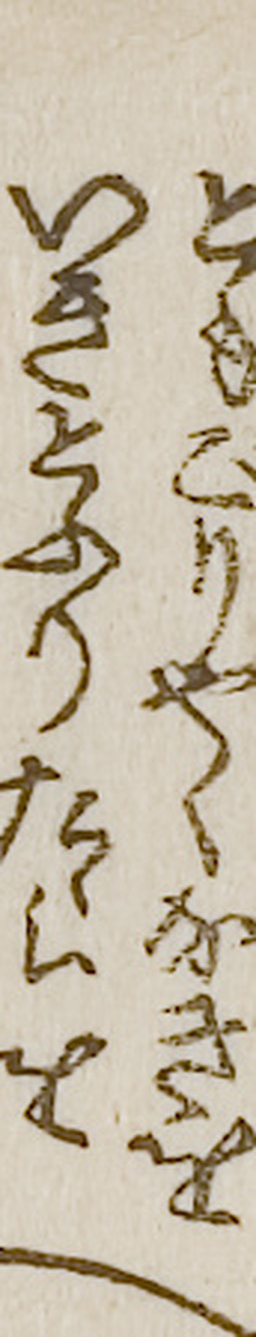いきとふりたゝらを
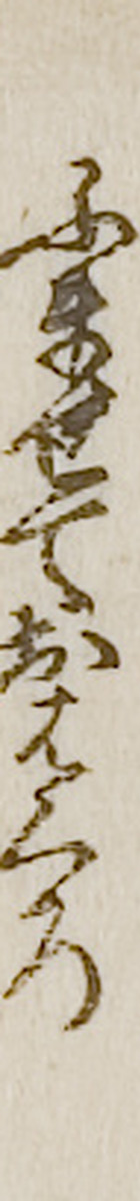ふませておはくろ
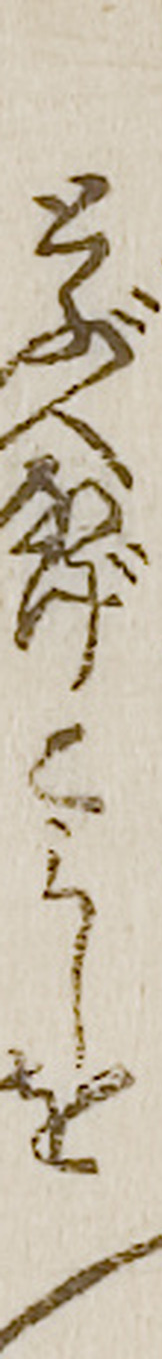とぶへなげこみしを
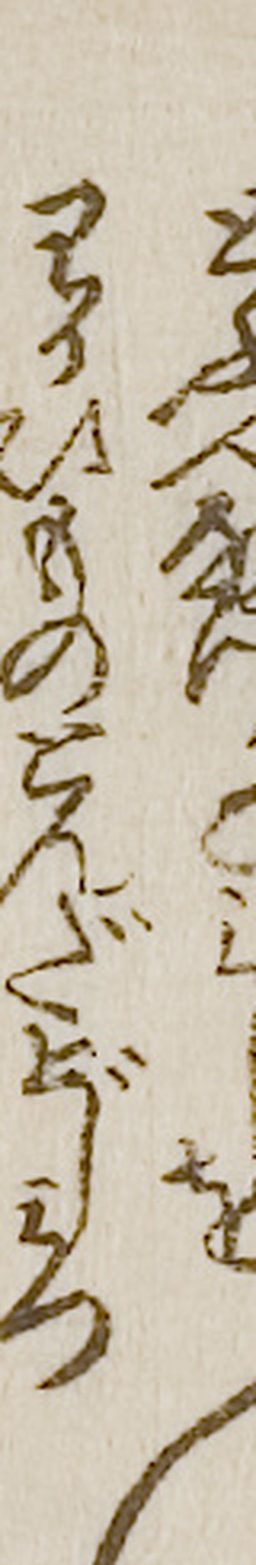わかひものとんだとじみつ
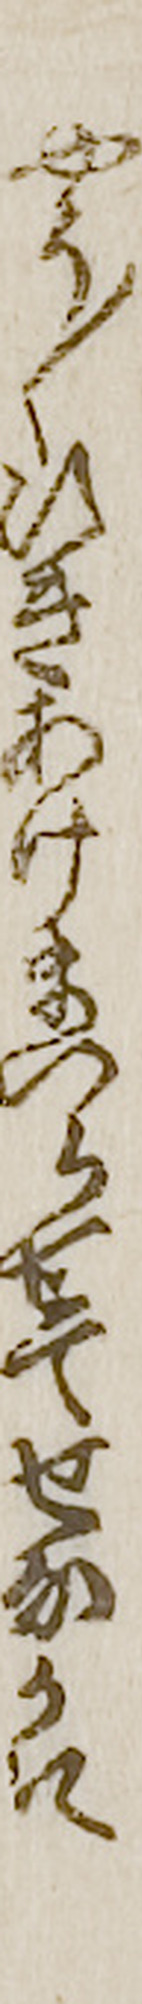やう〳〵ひきあけまいらせてせなかに
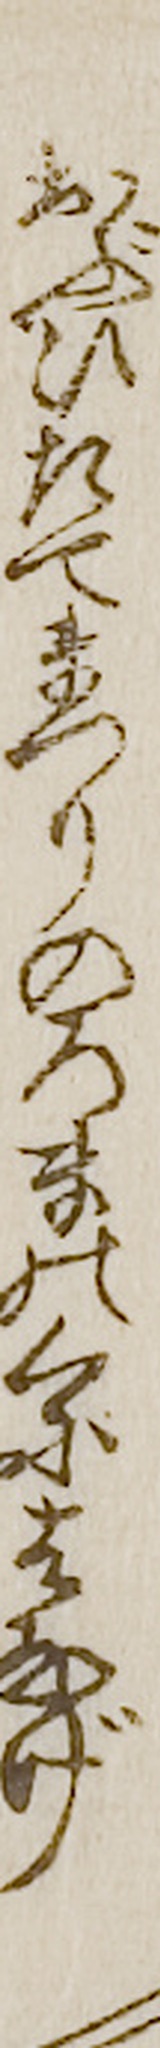おぶひたてまつりのろまのくにはなげ
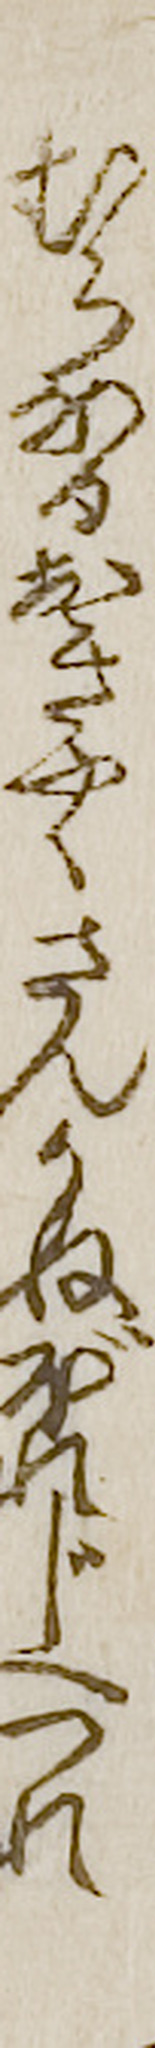むらなるおきやくさんかねぼれじへつれ
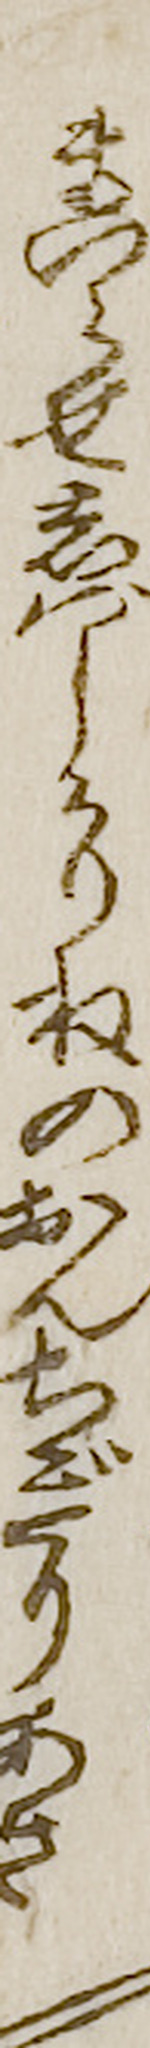まいらせしばしかりねのおんちぎりあさ
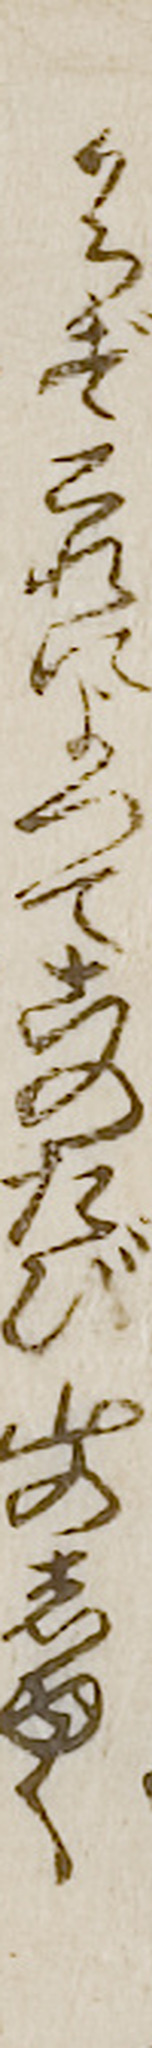からずこれによつてこのたび山のしゆく
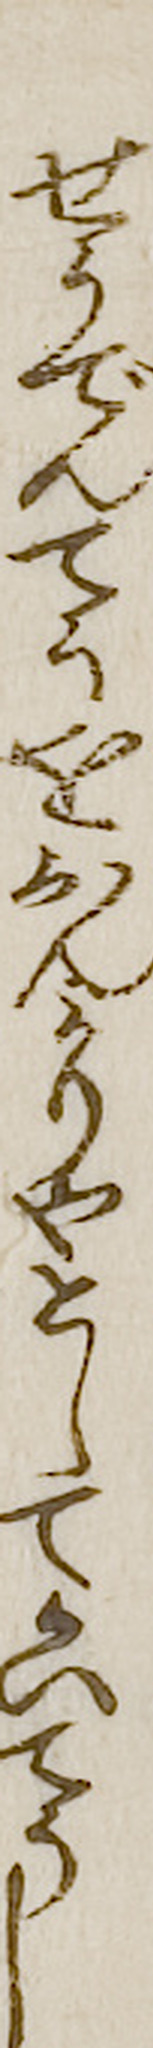せうでんてうをおんかりやとしてかいてうし
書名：泪如来の損像 山の宿聖天町ニて有頂天五十日の間開帳
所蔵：東京大学総合図書館 General Library in the University of Tokyo, JAPAN
